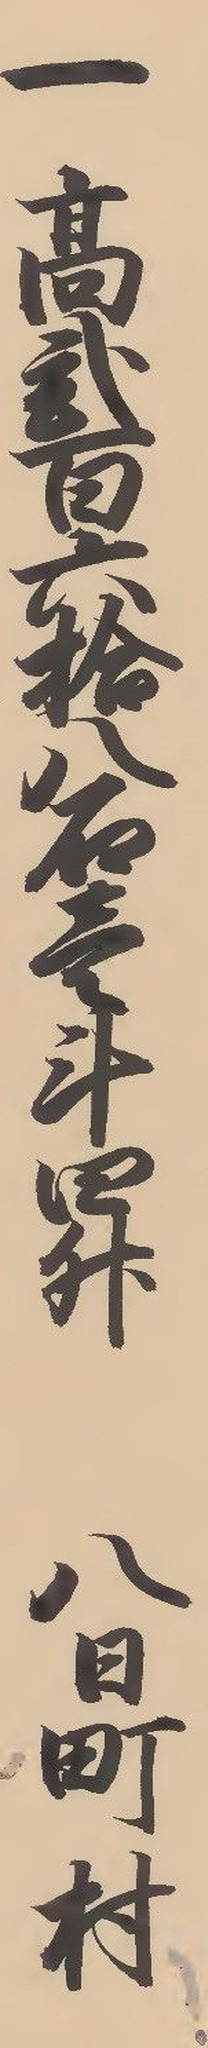一高弐百六拾八石壱斗四升八日町村

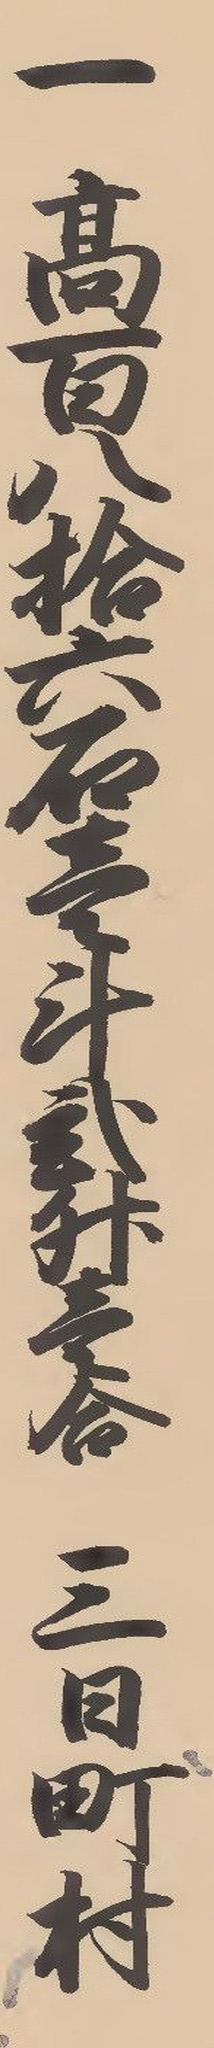一高百八拾六石壱斗弐升壱合三日町村
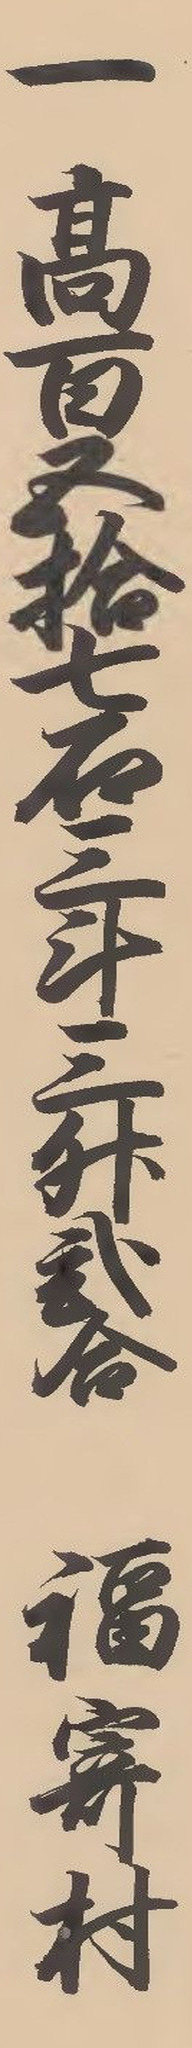一高百五拾七石三斗三升弐合福寄村
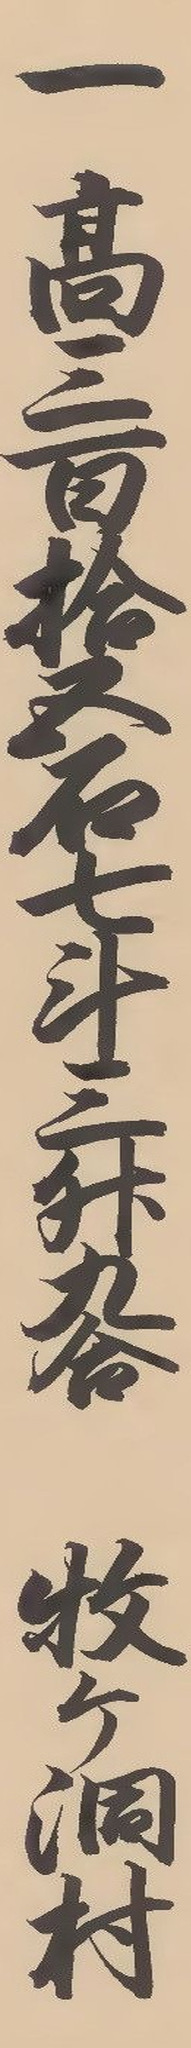一高三百拾五石七斗三升九合牧ヶ洞村
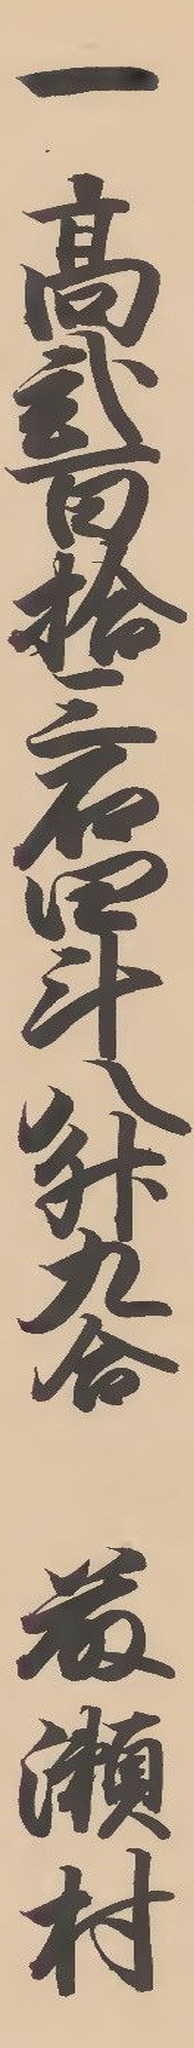一高弐百拾三石四斗八升九合藤瀬村
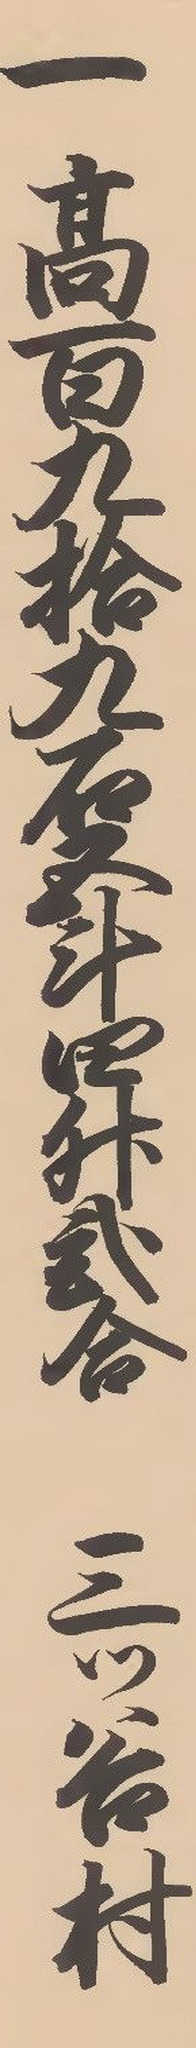一高百九拾九石五斗四升弐合三ツ谷村
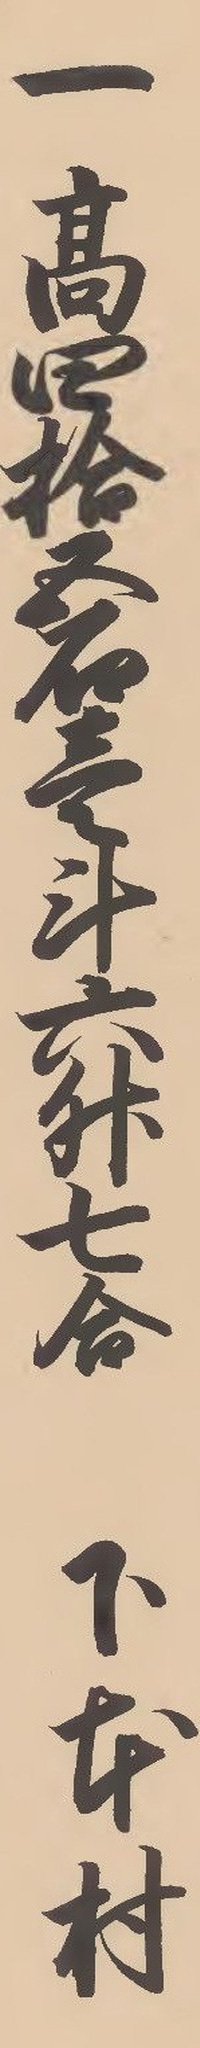一高四拾五石壱斗六升七合下本村
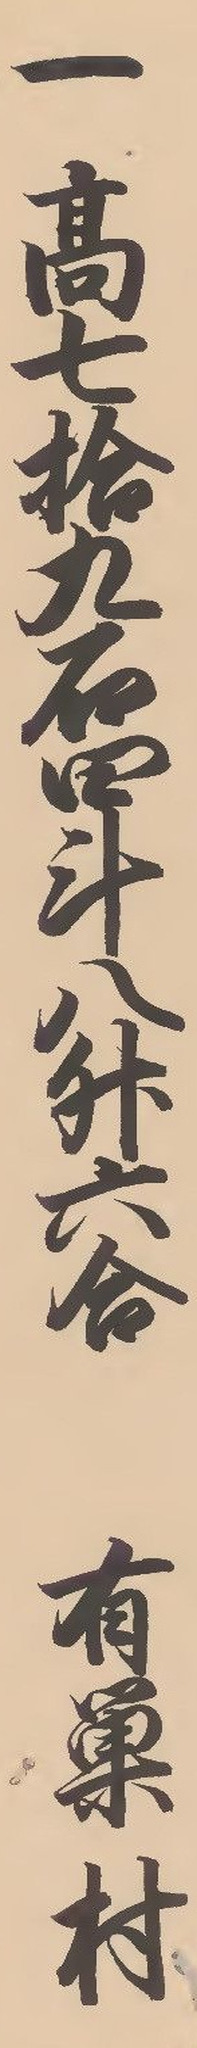一高七拾九石四斗八升六合有巣村

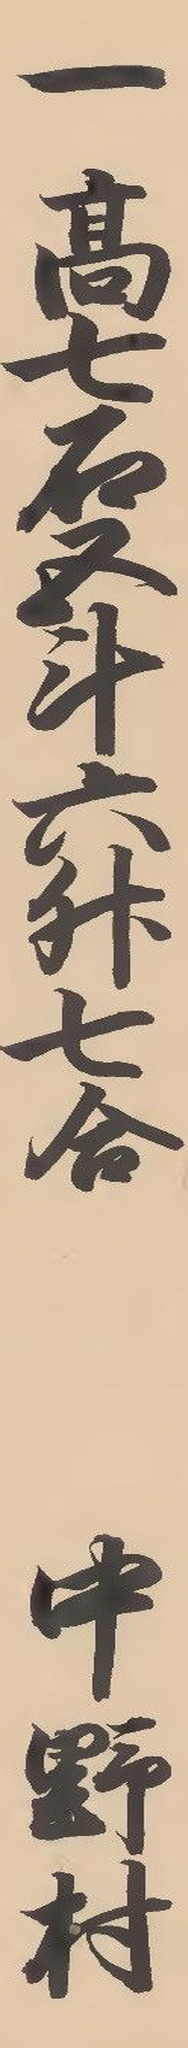一高七石五斗六升七合中野村
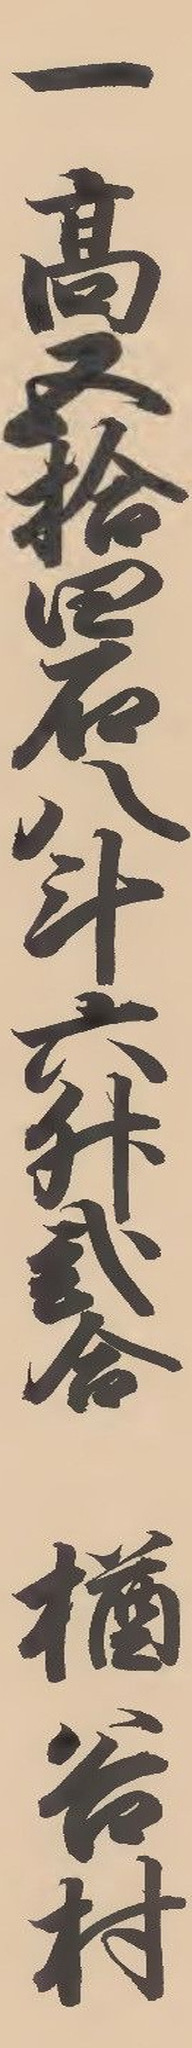一高五拾四石八斗六升弐合楢谷村
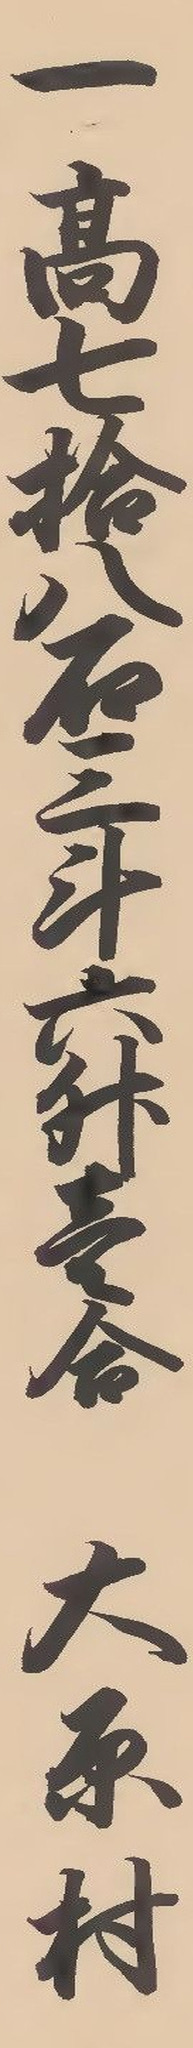一高七拾八石三斗六升壱合大原村
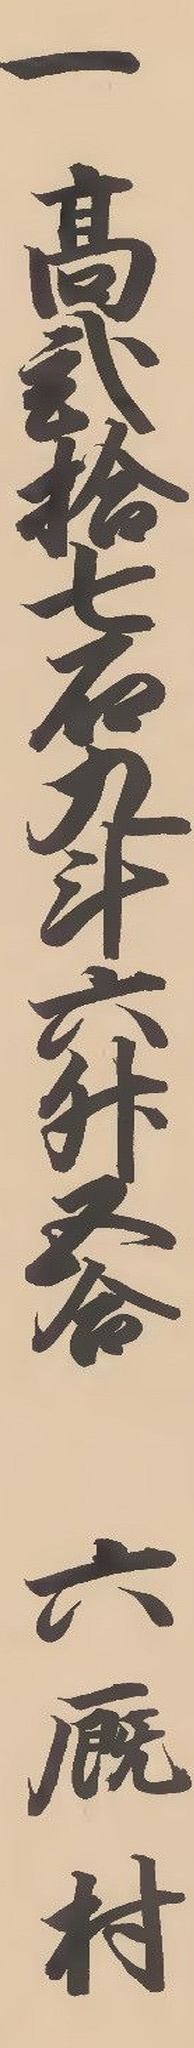一高弐拾七石九斗六升五合六厩村
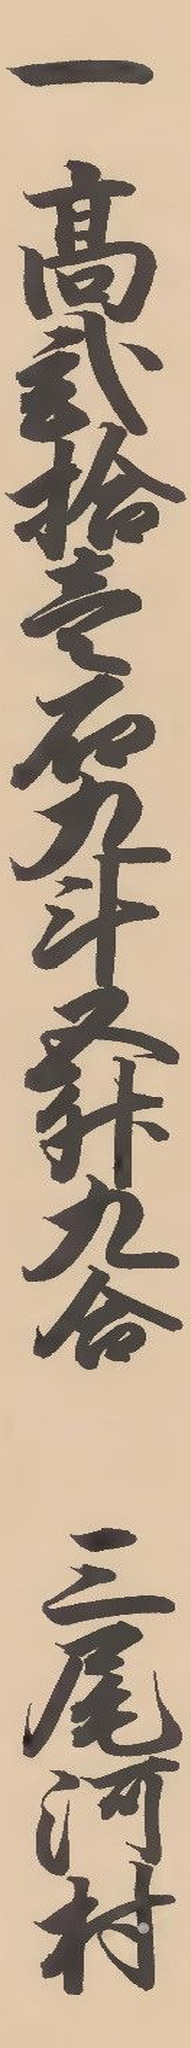一高弐拾壱石九斗五升九合三尾河村
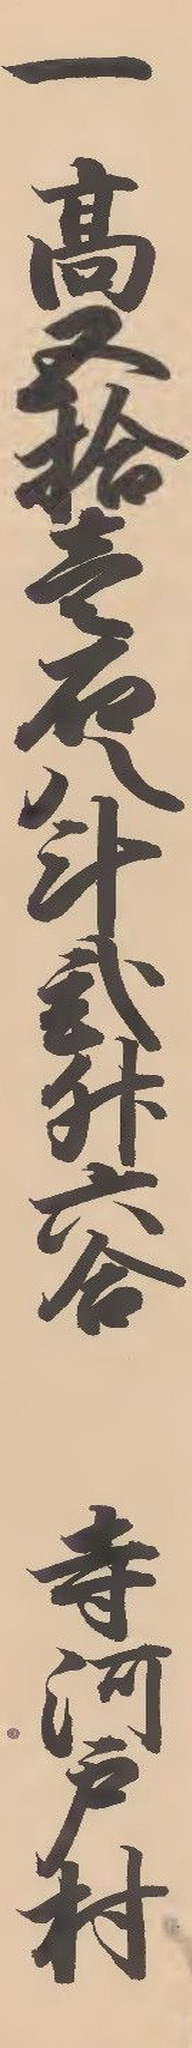一高五拾壱石八斗弐升六合寺河戸村

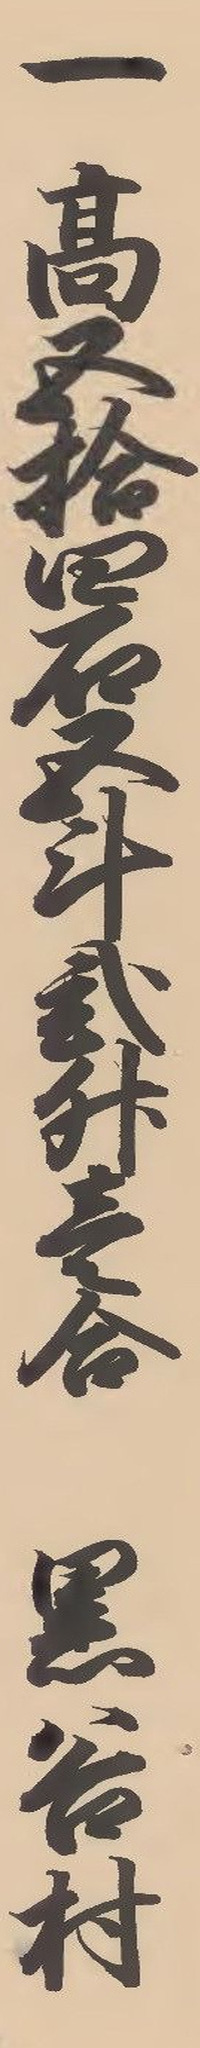一高五拾四石五斗弐升壱合黒谷村
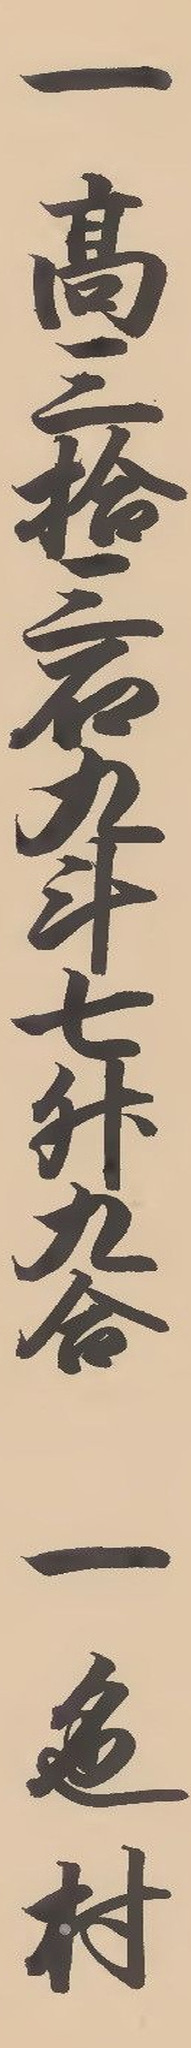一高三拾三石九斗七升九合一色村
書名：飛騨国郷帳
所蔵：国立公文書館 National Archives of Japan
